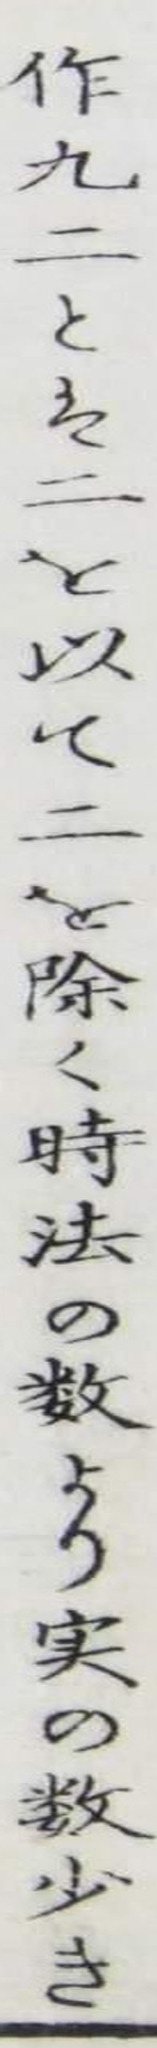作九二とは二を以て除く時法の数より実の数少き
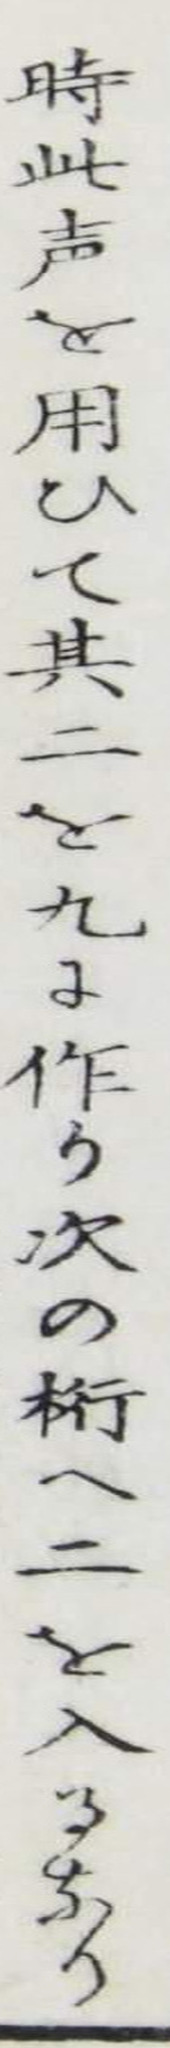時此声を用ひて其二を九に作り次の桁へ二を入るなり
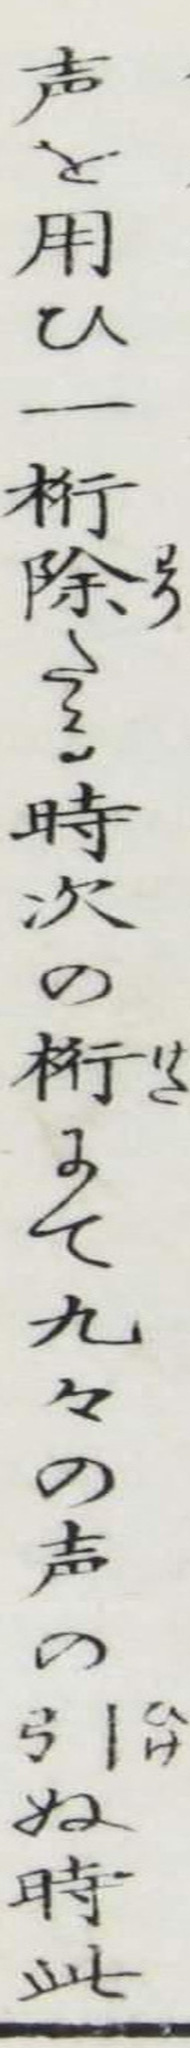声を用ひ一桁除たる時次の桁にて九々の声の引ぬ時此
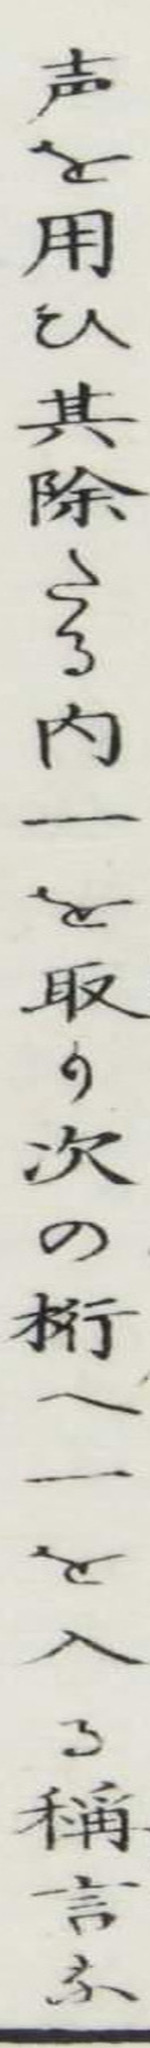声を用ひ其除たる内一を取り次の桁へ一を入る称言な
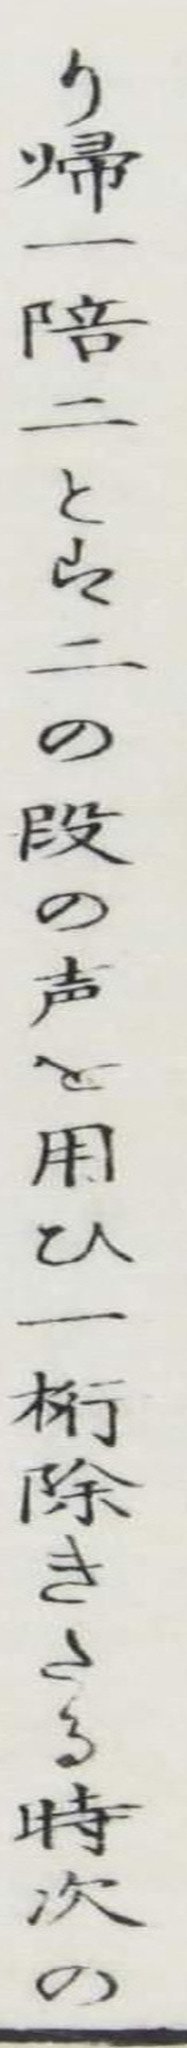り帰一陪二とは二の段の声を用ひ一桁除きたる時次の
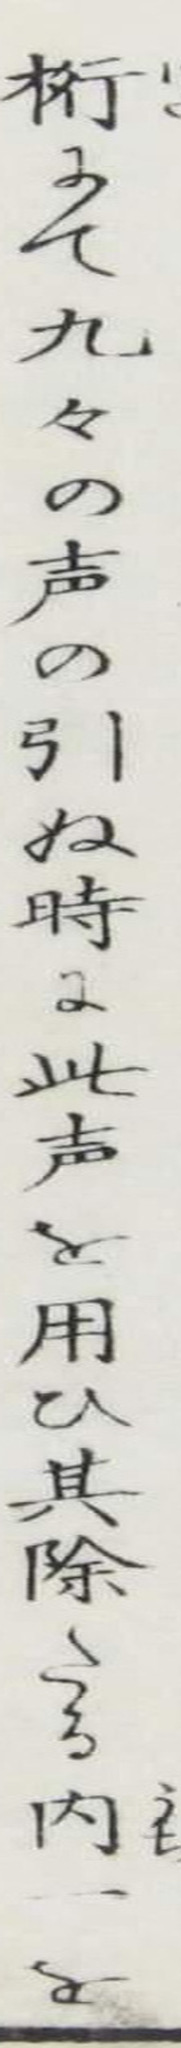桁にて九々の声の引ぬ時に此声を用ひ其除たる内一を
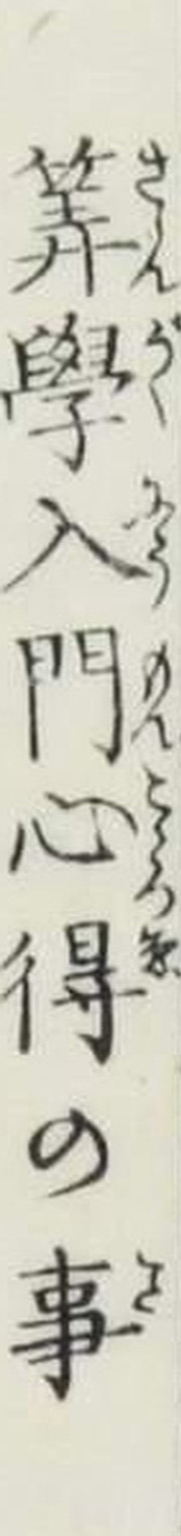算学入門心得の事
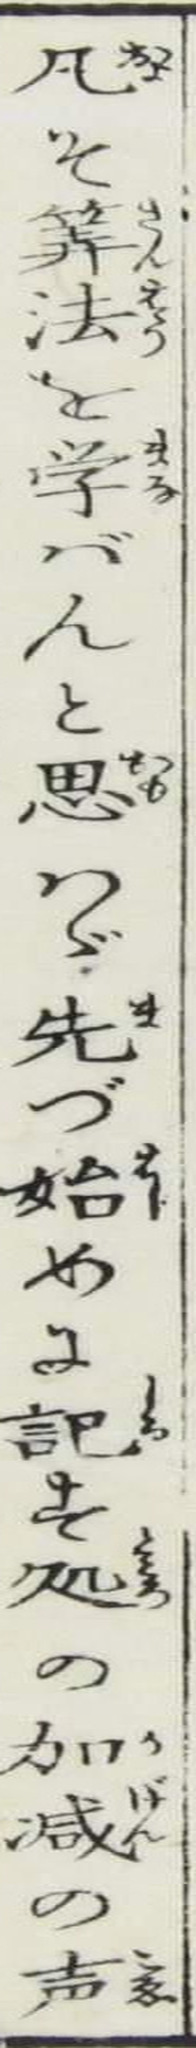凡そ算法を学ばんと思はゞ先づ始めに記す処の加減の声
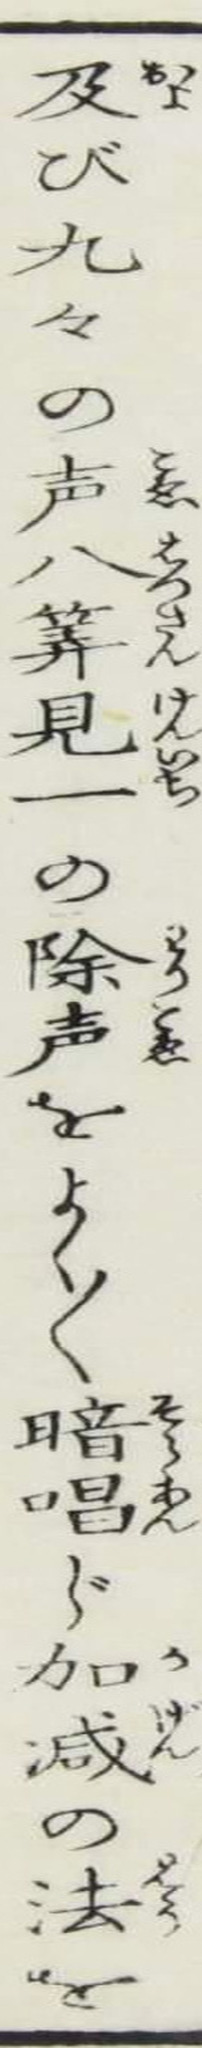及び九々の声八算見一の除声をよく〳〵暗唱じ加減の法を
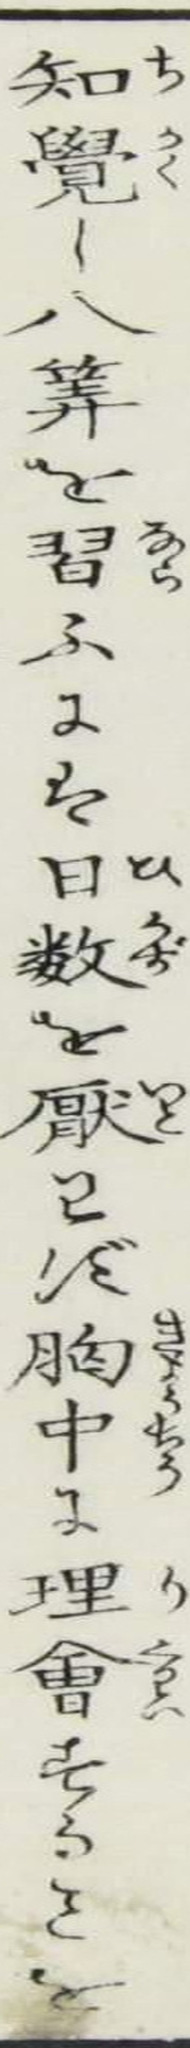知覚し八算を習ふには日数を厭わず胸中に理会することを
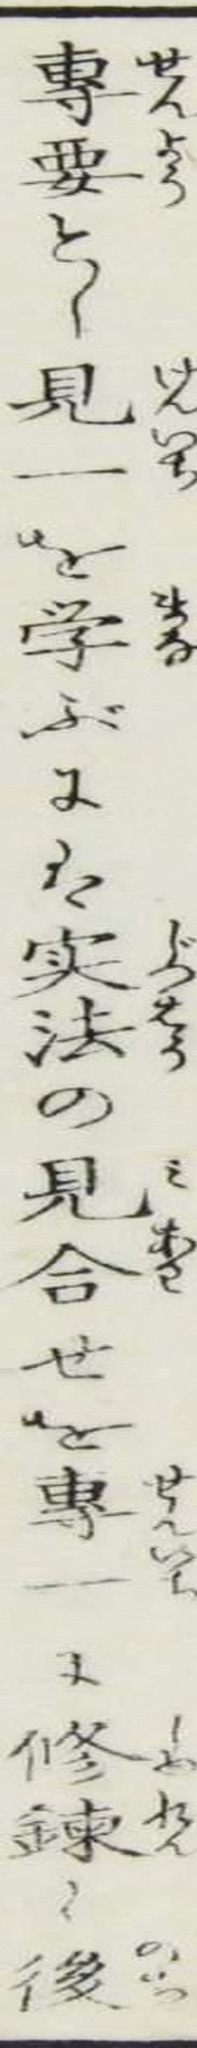専要とし見一を学ぶには実法の見合せを専一に修錬し後
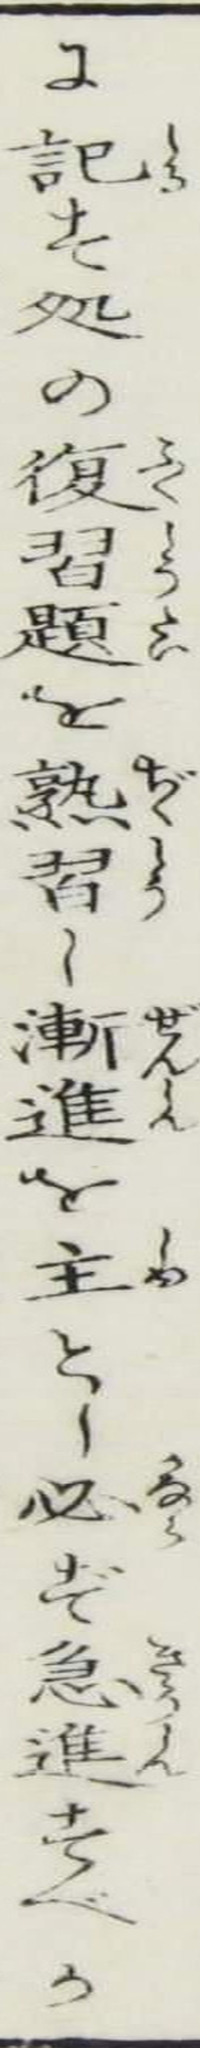に記す処の復習題を熟習し漸進を主とし必ず急進すべか
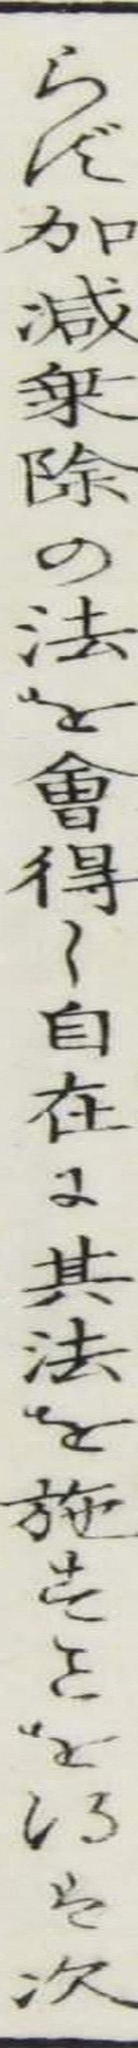らず加減乗除の法を会得し自在に其法を施す事を得は次
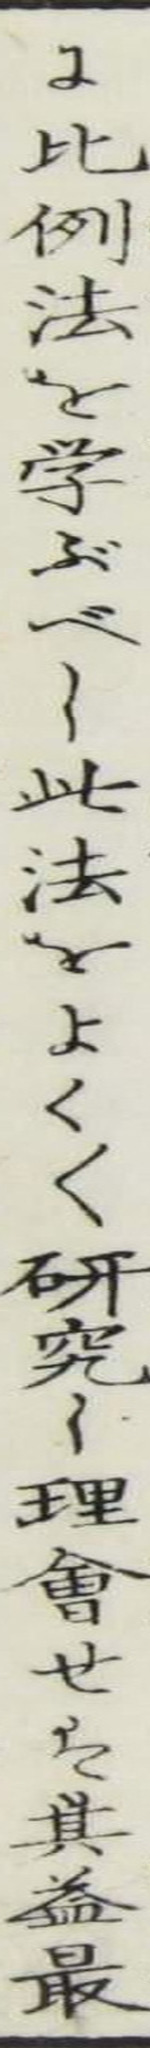に比例法を学ぶべし此法をよく〳〵研究し理会せは其益最
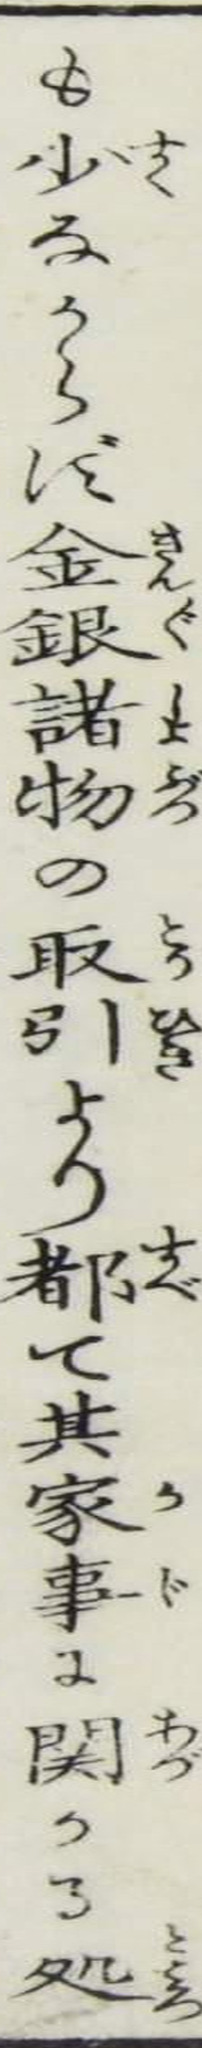も少なからず金銀諸物の取引より都て其家事に関かる処
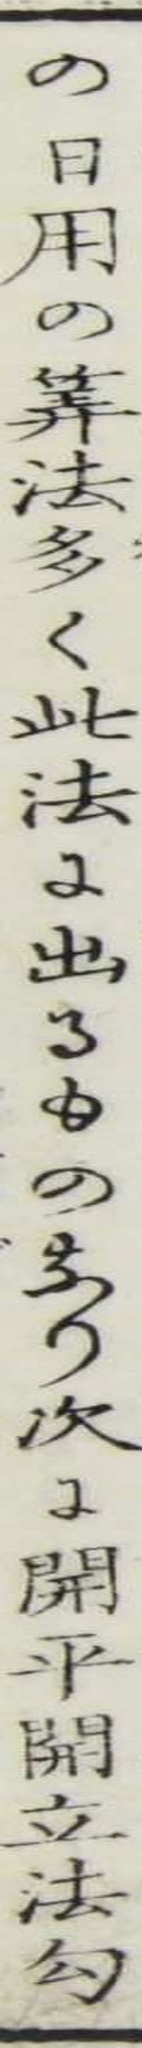の日用の算法多く此法に出るものなり次に開平開立法勾
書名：明治小學塵劫記 卷1
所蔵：東京学芸大学教育コンテンツアーカイブ
